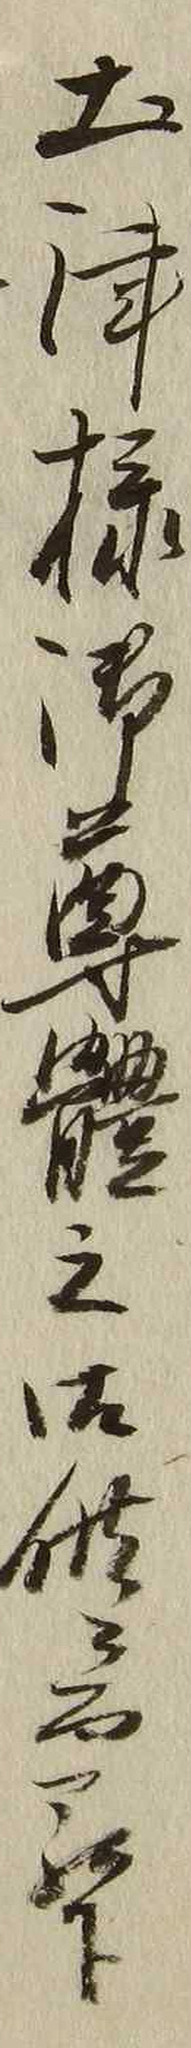土津様御尊体之御供ニ而罷下
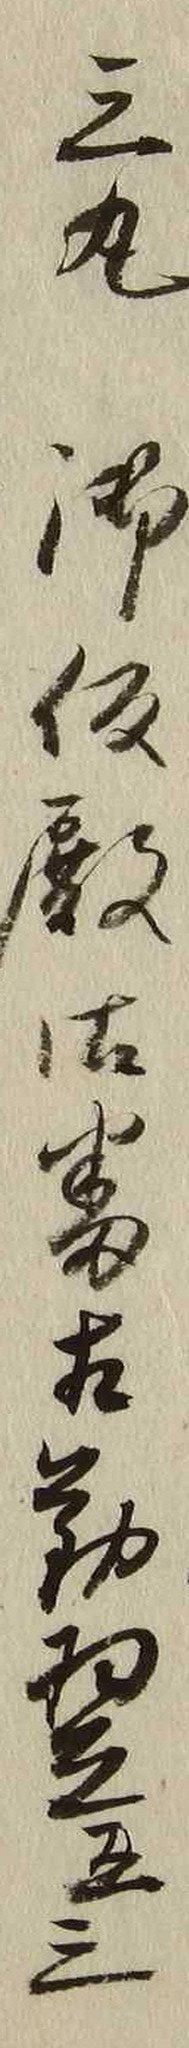三丸御仮殿御番相勤翌丑三
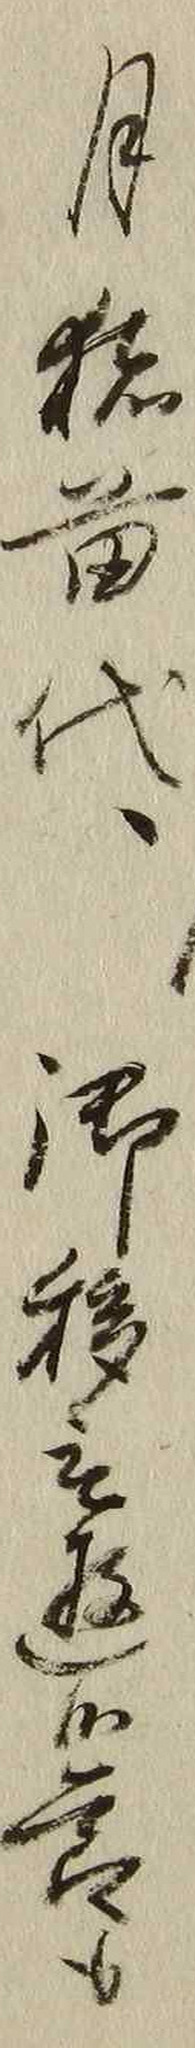月猪苗代へ御移被遊候節も
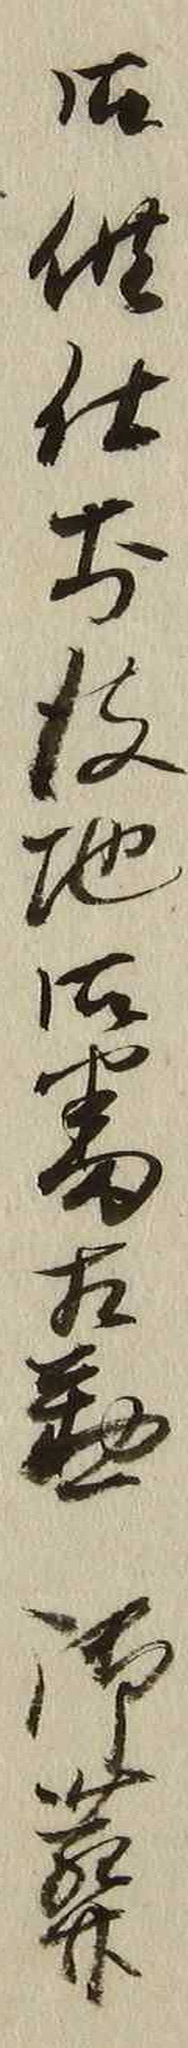御供仕於彼地御番相勤御葬
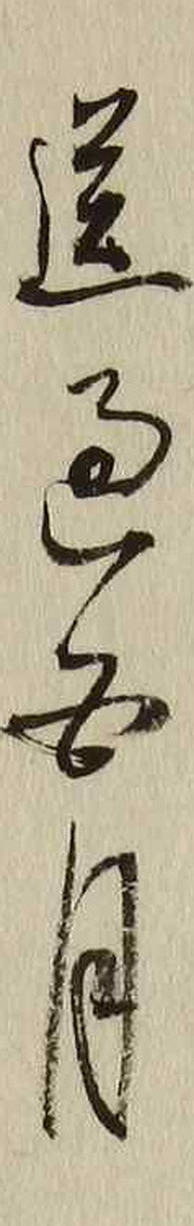送過五月
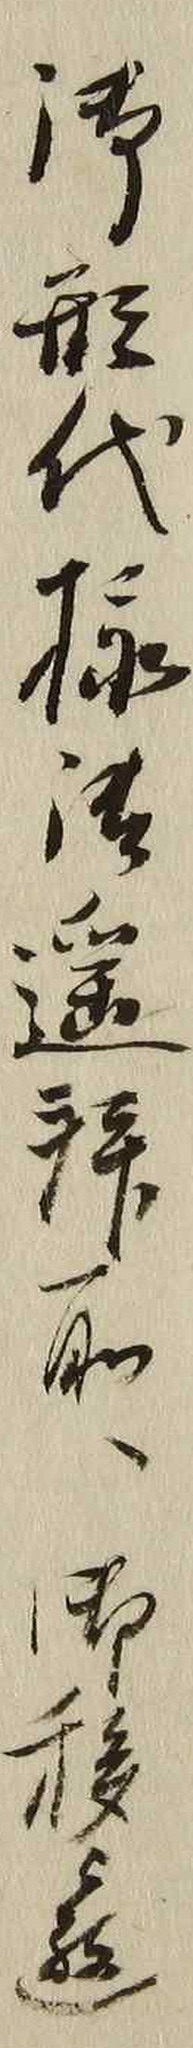御形代様御遥拝所へ御移被遊
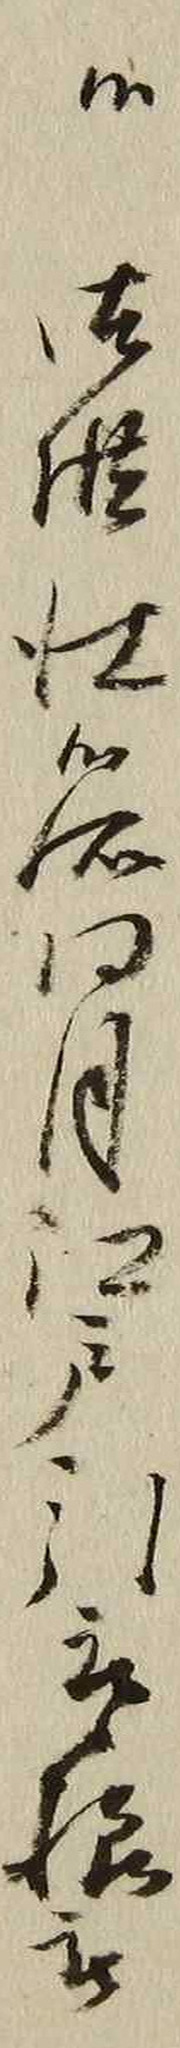候御供仕候所同月江戸取候様被
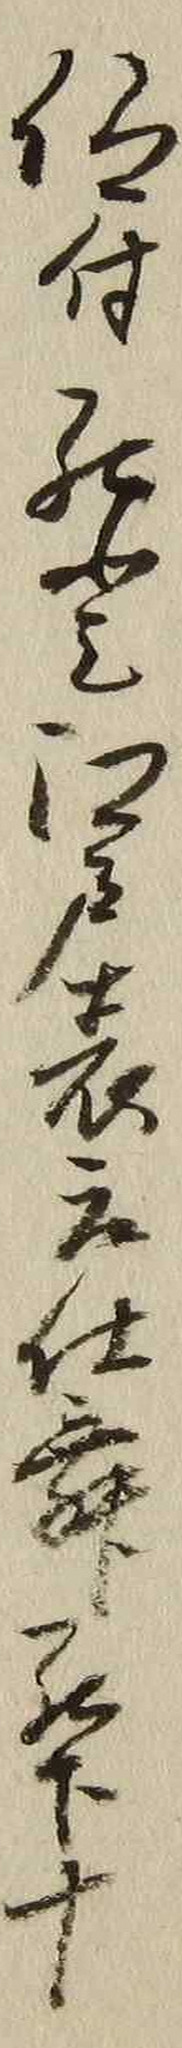仰付罷登江戸表取仕舞罷下十
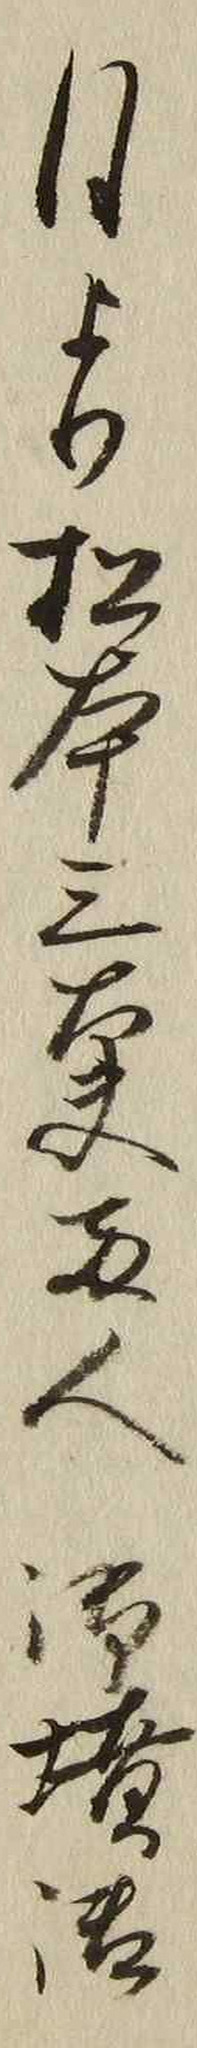月より松本三大夫両人御墳御
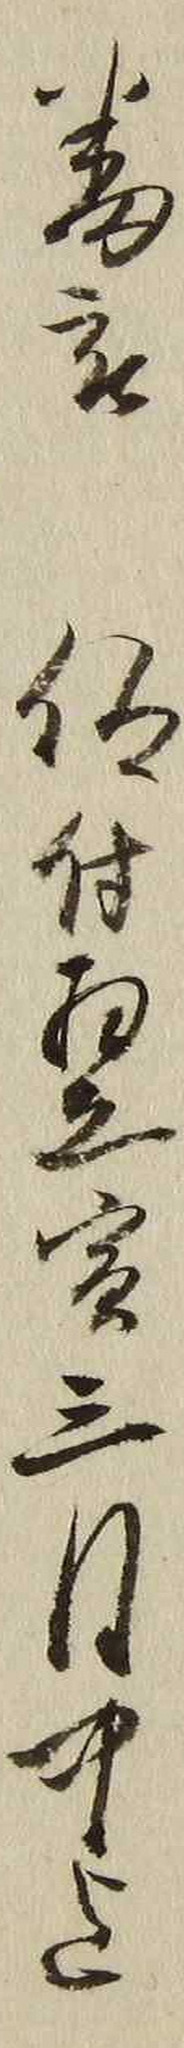番被仰付翌寅三月中迄
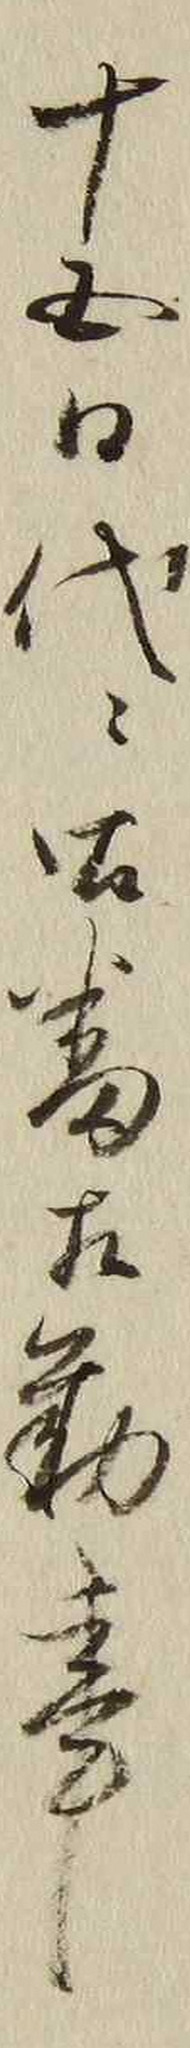十五日代々御番相勤候事
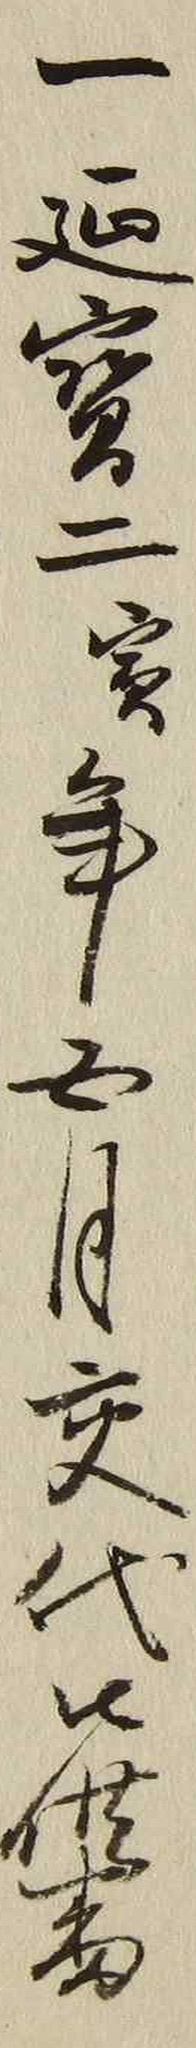一延宝二寅年五月交代御供番
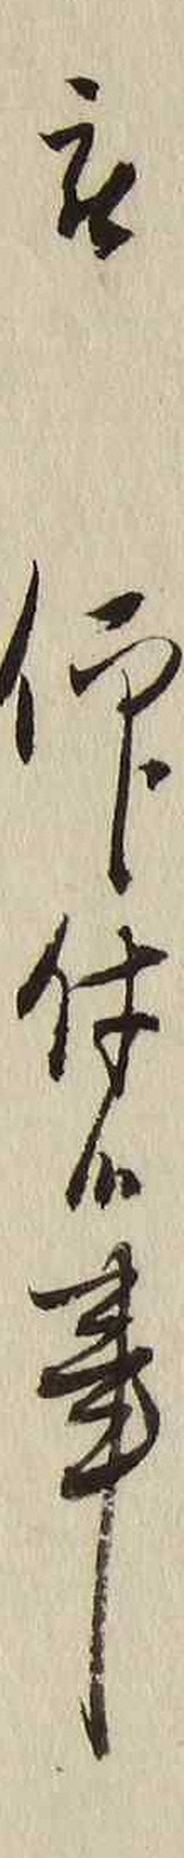被仰付候事
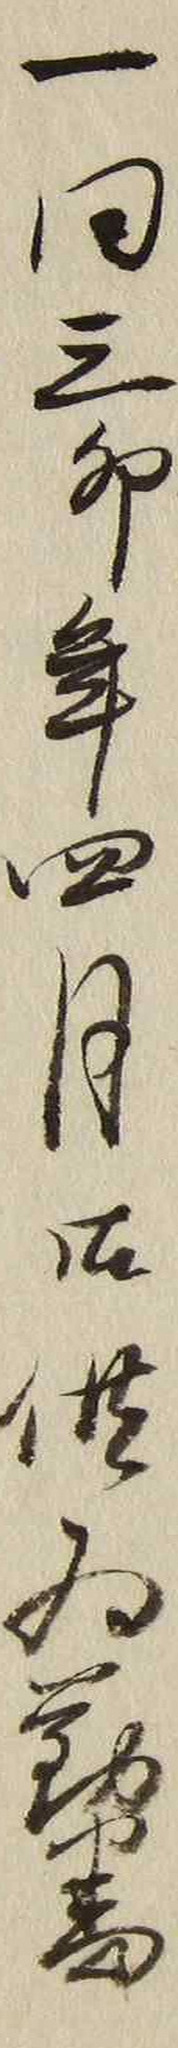一同三卯年四月御供為勤番
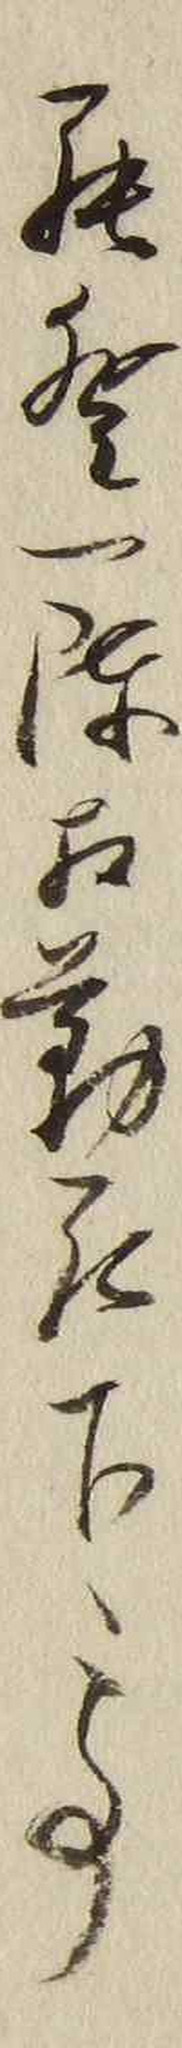罷登一陣相勤罷下候事

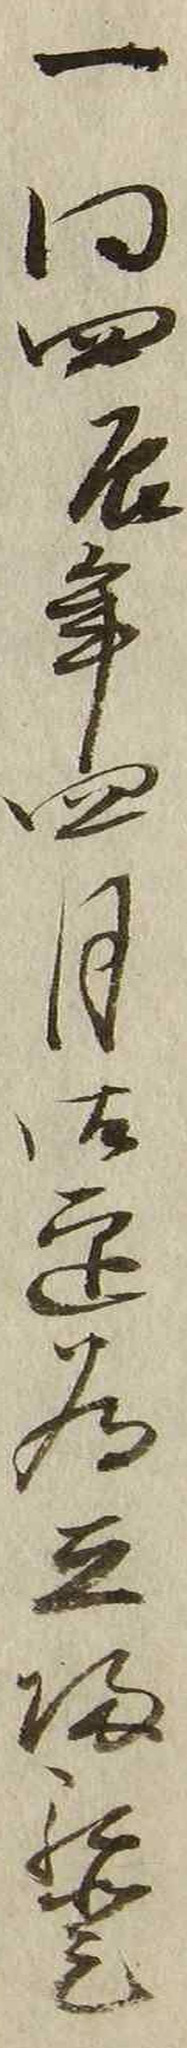一同四辰年四月御迎為立帰罷登
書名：諸士系譜　巻之352　す之部2
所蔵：会津若松市立会津図書館
